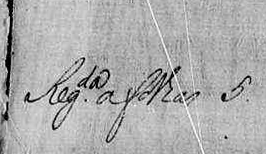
Reg.da a folhas 5
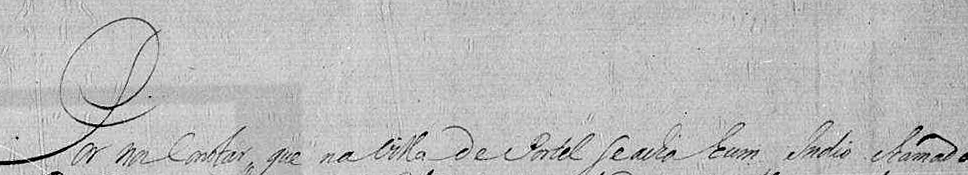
Por nos Constar que na Villa de Portel se acha hum Indio chamado
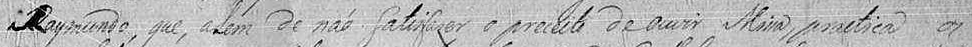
Raymundo, que alem de naõ satisfazer o preceito de ouvir Missa, pratica os
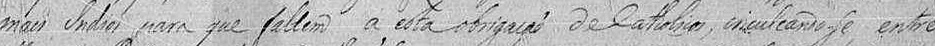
mais Indios para que faltem a esta obrigaçaõ de Catholicos, circulando-se entre
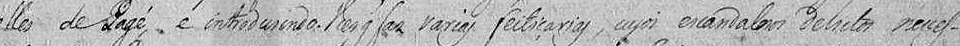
elles de Pagé, e introdusindo lhes q̄ faz varias feitiçarias, cujos escandalosos delictos necces
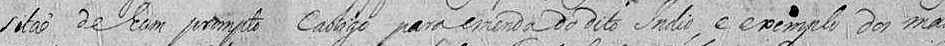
sitaõ de hum promto Castigo para emenda do dito Indio, e exemplo dos mais
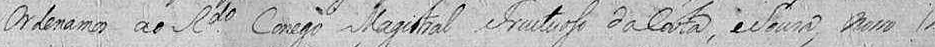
Ordenamos ao R.do Conego Magistral Fructuoso da Costa, e Souza, nosso Vi
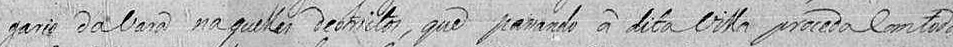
gario da vara naquelles destrictos, que passando à dita Villa proceda Com toda
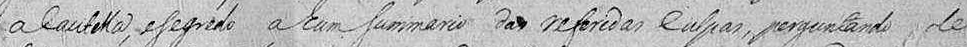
a Cautella, e segredo a hum sumario das referidas Culpas, perguntando de
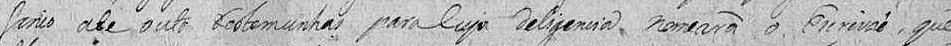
ferio ate outo testemunhas para Cuja deligencia nomeará o Escrivaõ que
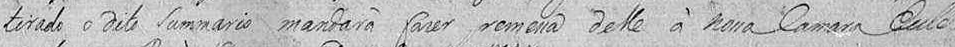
tirado o dito summario mandará fazer remessa delle à nossa Camara Eccle
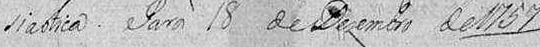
siastica. Pará 18 de Dezembro de 1757
